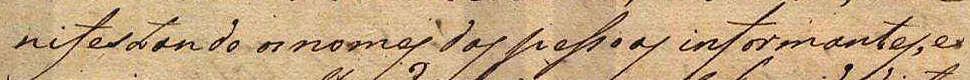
nifestando os nomes das pessoas informantes, e
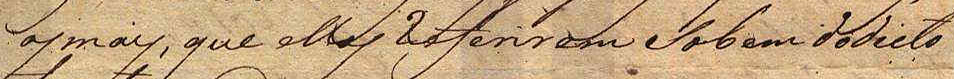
as mais, que ellas Referirem sabem do dicto
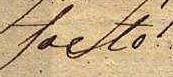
facto
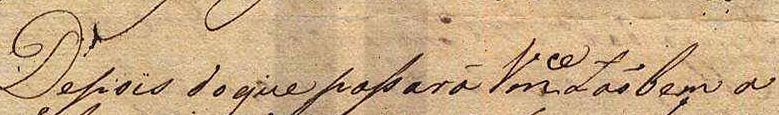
Depois do que passará Vm.ce taõbem a
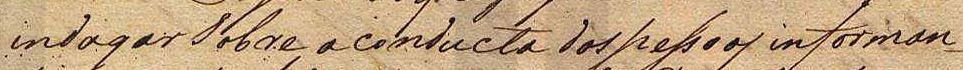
indagar sobre a conducta das pessoas informan
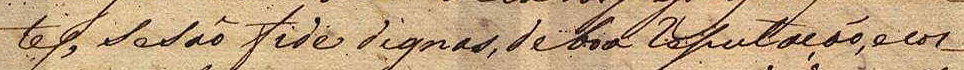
tes, se saõ fidedignas, de boa Reputaçaõ, e cos
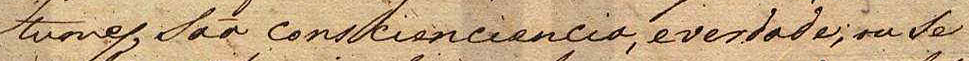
tumes, saã conscienciencia, e verdade; ou se
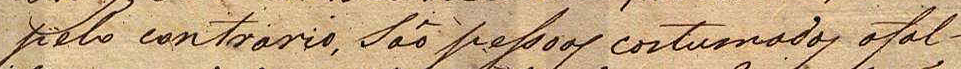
pelo contrario, saõ pessoas costumadas a fal
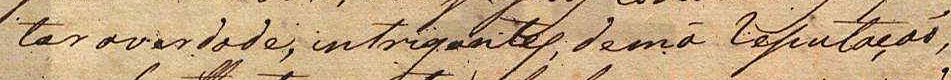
tar a verdade, intrigantes, de má Reputaçaõ,
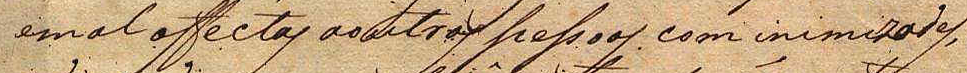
e mal affectas a outras pessoas com inimizades,
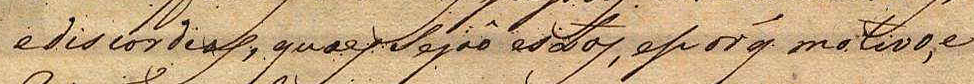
e discordias, quaes Sejaõ estas, e por q̄ motivo, e
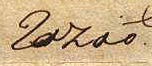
Razaõ
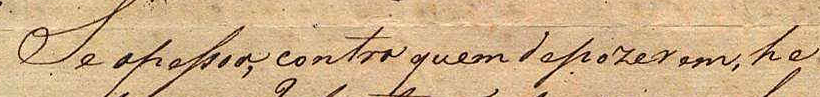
Se a pessoa, contra quem depozerem, he
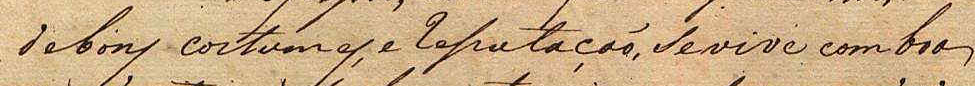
de bons costumes, e Reputaçaõ, se vive com boa
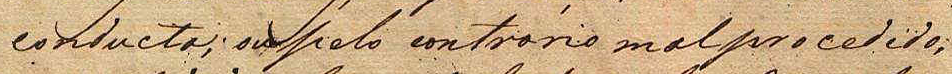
conducta; ou pelo contrario mal procedido;
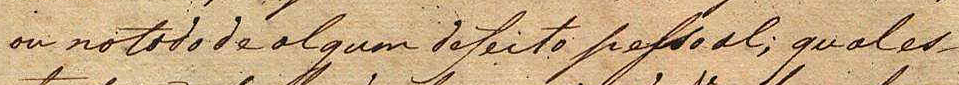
ou notado de algum defeito pessoal; qual es
